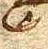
q̄
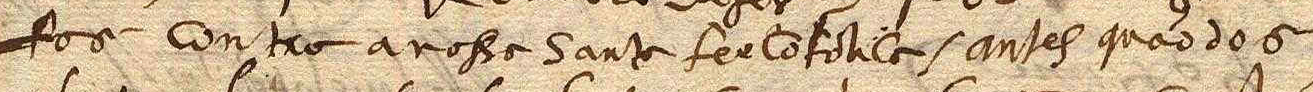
fose contra a nossa santa fee catolica / antes quaõdo se
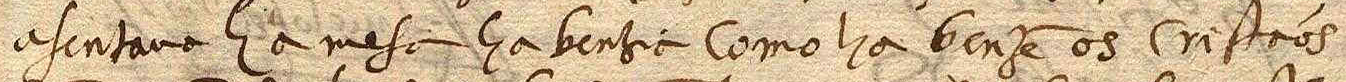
asentaua ha mesa ha benzia Como ha benzē os cristaõs
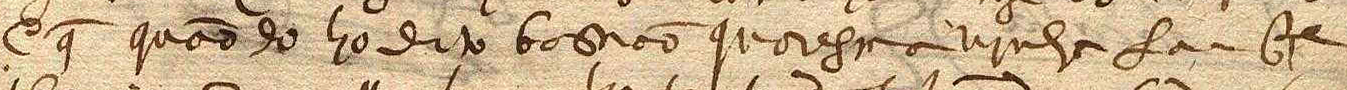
e q̄ quãodo ho dito bastiaõ quaresma ujnha ha este
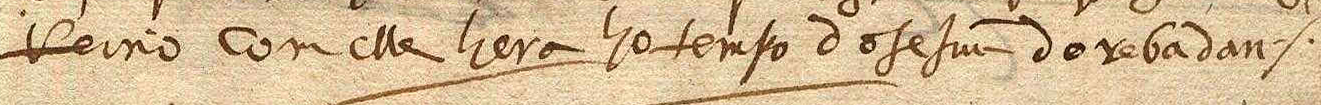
Reino com elle hera ho tempo do JeJuū do rebadan ./.
